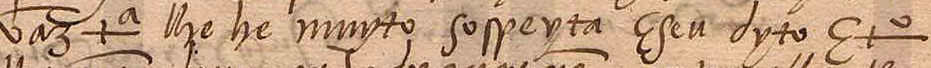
vāz ta lhe he muyto sospeyta E seu dyto E to
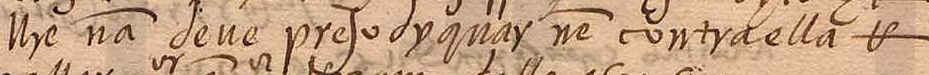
lhe nā deue preJodyquar n̄e contra ella R
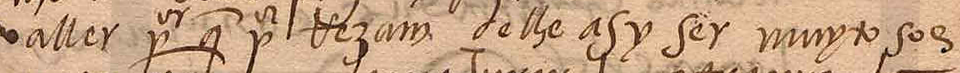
valler porq̄ por Rezam de lhe asy ser muyto sos
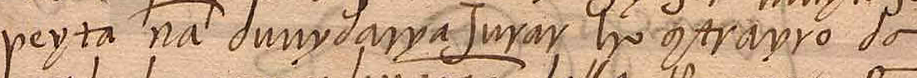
peyta nā duuydarya Jurar ho ꝯtrayro da
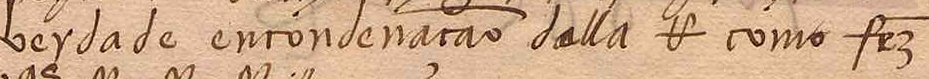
verdade en condenação della R como fez
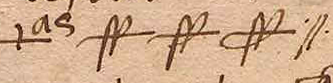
tas ff ff ff .//.
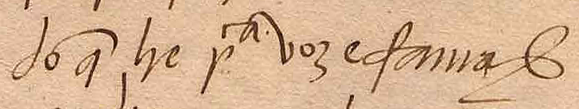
do q̄ he pca voz e fama
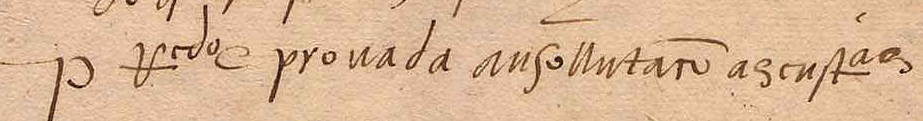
P Redo e prouada ausolluta c̄o as custas
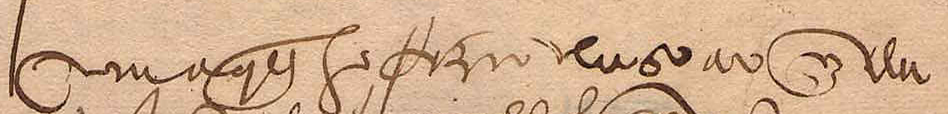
Com a q̄ll ho fyz c̄ocluso ao sōr dou
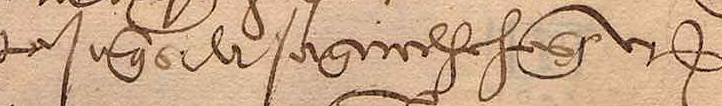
tor Jnq̄sydor Jorge coelho ho esp̄vy
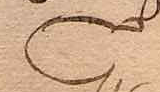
Co
